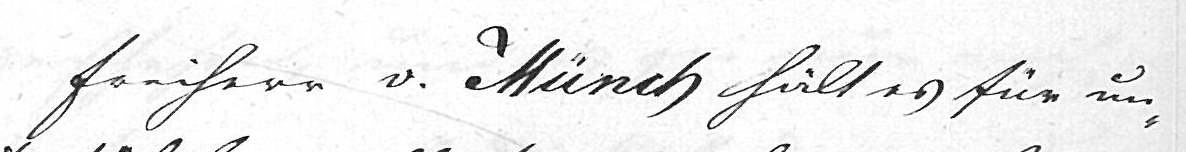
Freiherr v. Münch hält es für un-
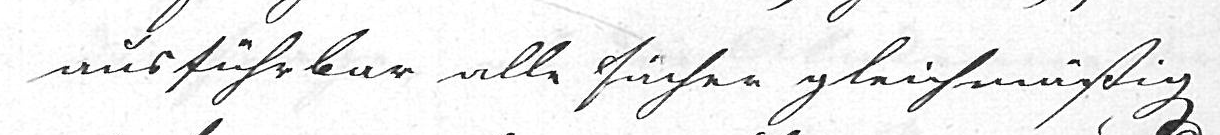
ausführbar alle Fächer gleichmäßig
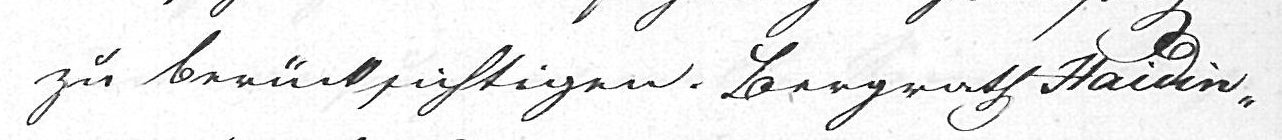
zu berücksichtigen. Bergrath Haidin-
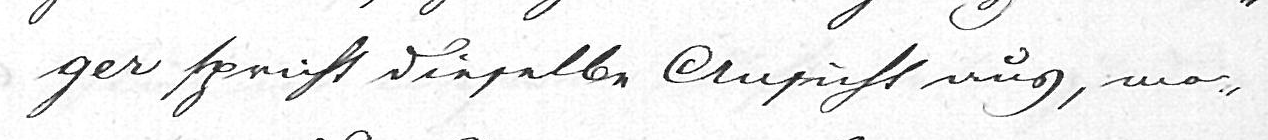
ger spricht dieselbe Ansicht aus, wo-
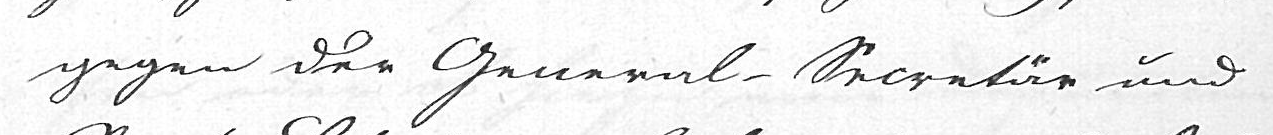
gegen der General-Secretär und
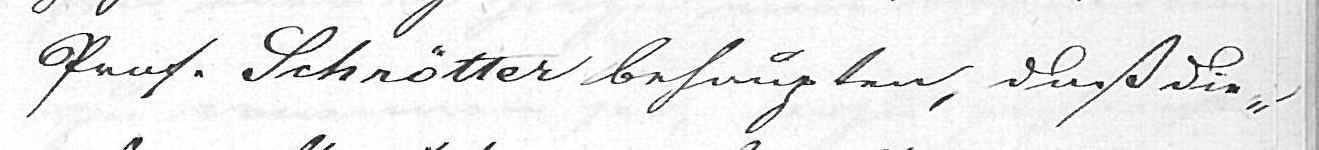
Prof. Schrötter behaupten, daß die-
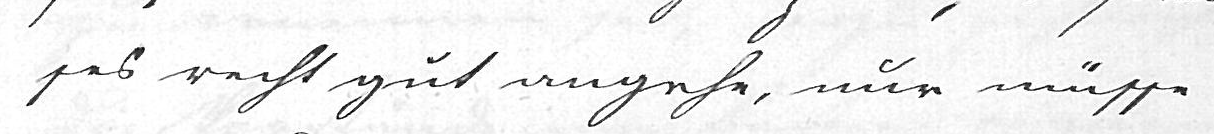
ses recht gut angehe, nur müsse
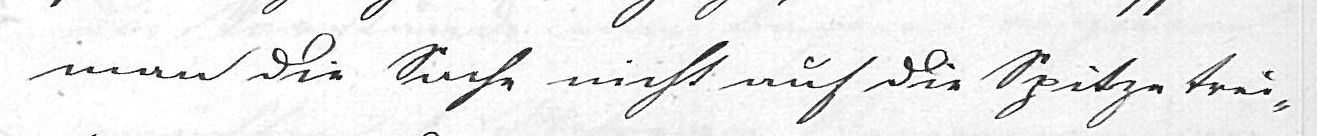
man die Sache nicht auf die Spitze trei-
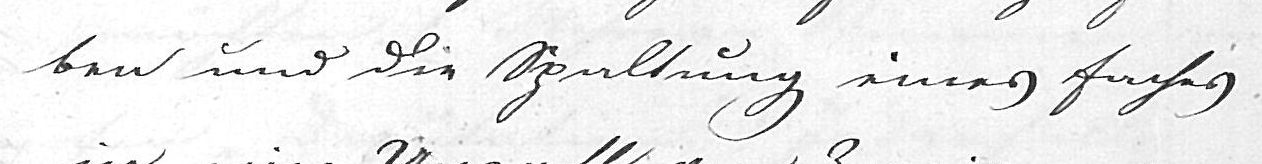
ben und die Spaltung eines Faches
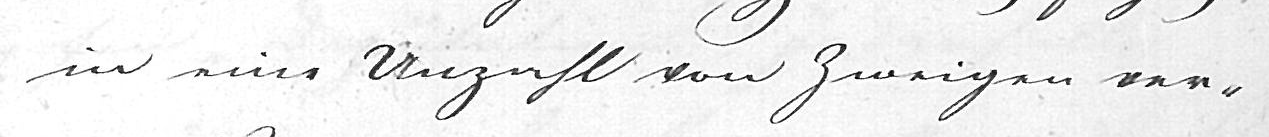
in eine Anzahl von Zweigen ver-
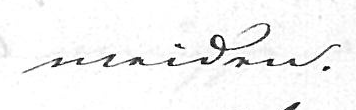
meiden.
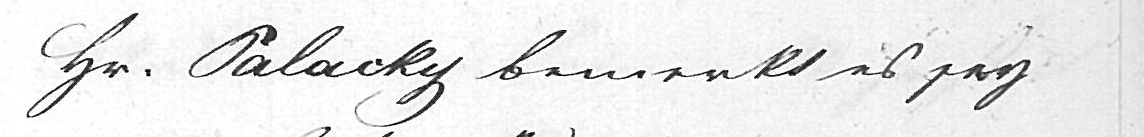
Hr. Palacky bemerkt es sey
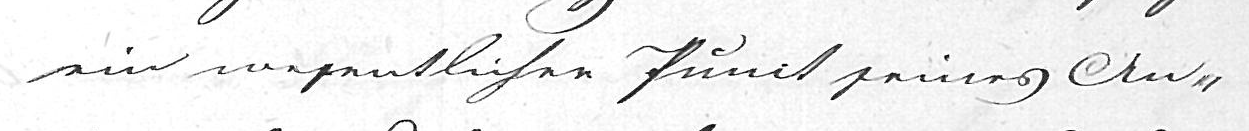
ein wesentlicher Punct seines An-
